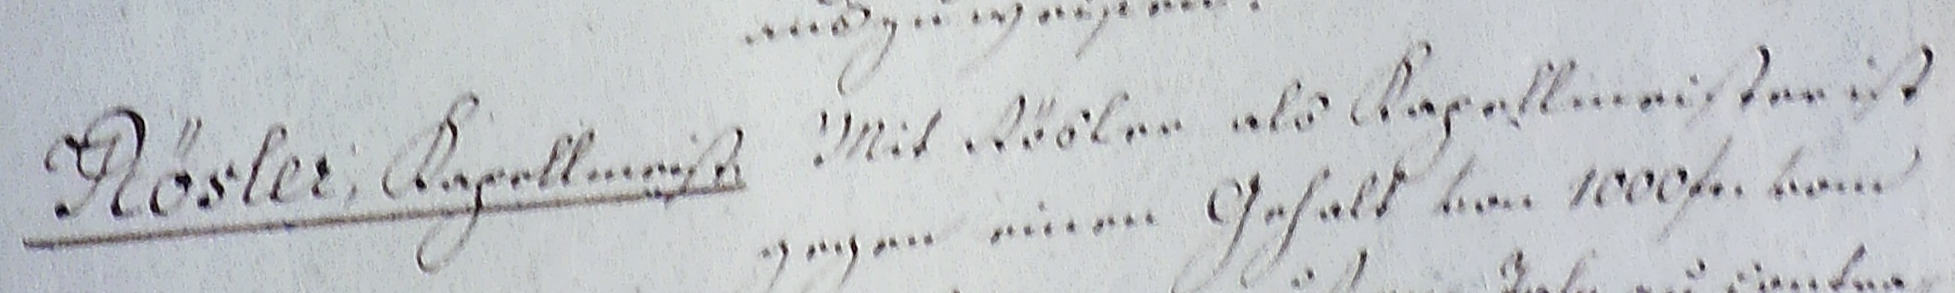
Rösler, Kapellmeist. Mit Rösler als Kapellmeister ist
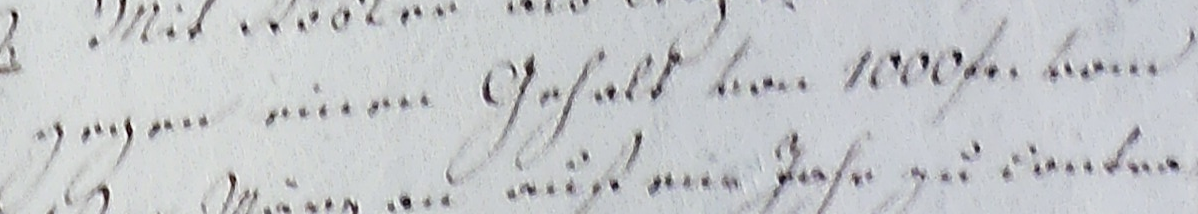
gegen einen Gehalt von 1000fr. vom
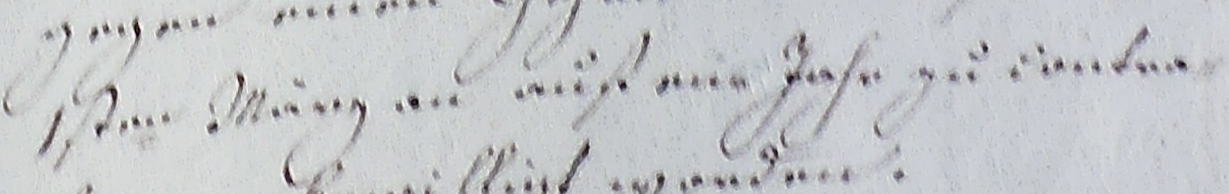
1sten März an auf ein Jahr zu contra¬
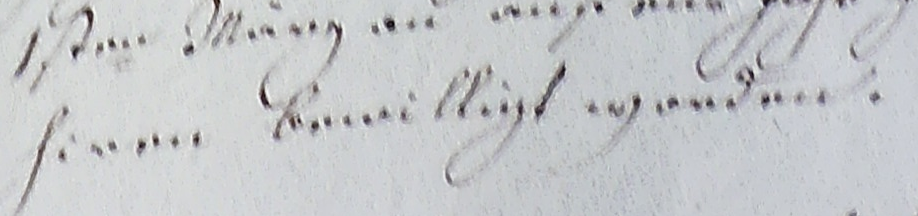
hiren bewilligt worden.
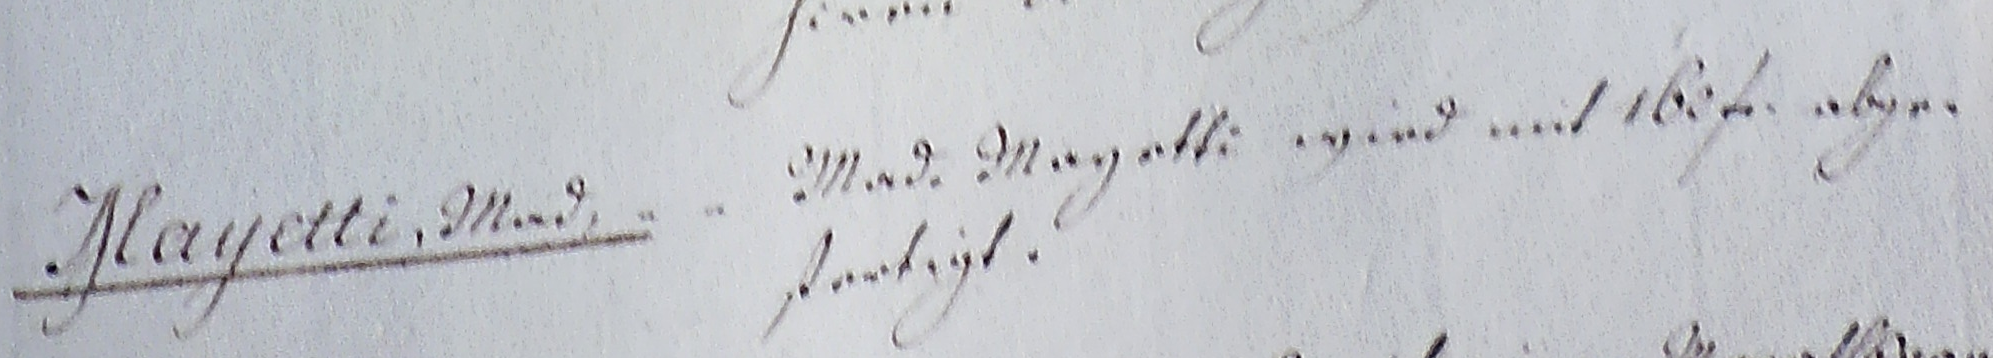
Mayetti, Mad, .. .. Mad: Mayetti wird mit 160fr. abge¬
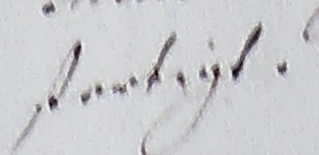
fertigt.
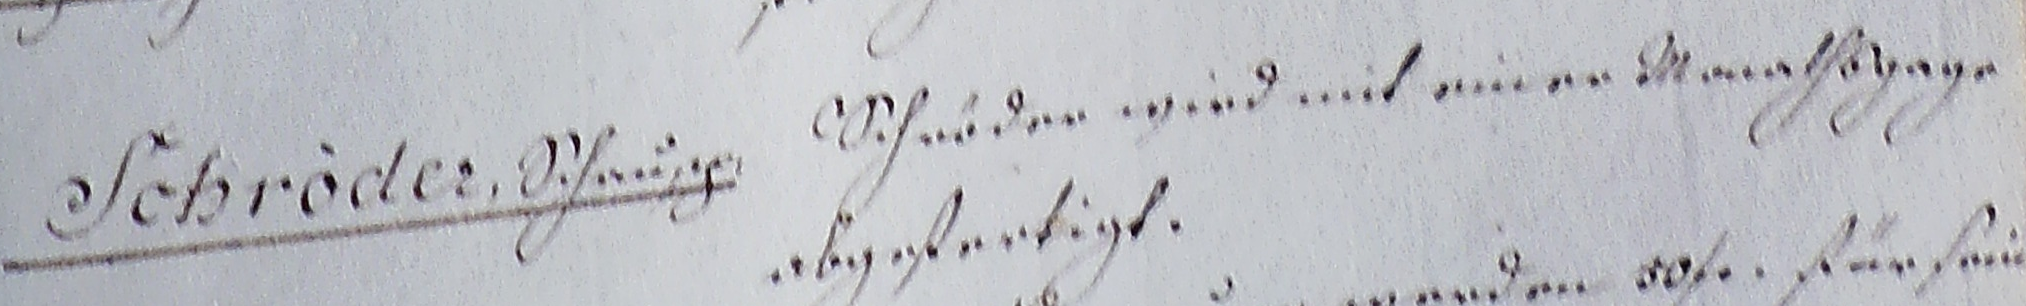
Schröder, Schausp. Schröder wird mit einer Monathsgage
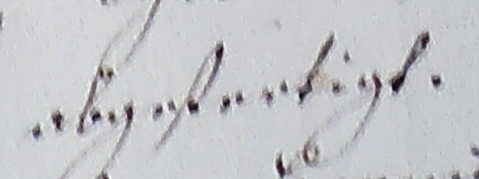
abgefertigt.
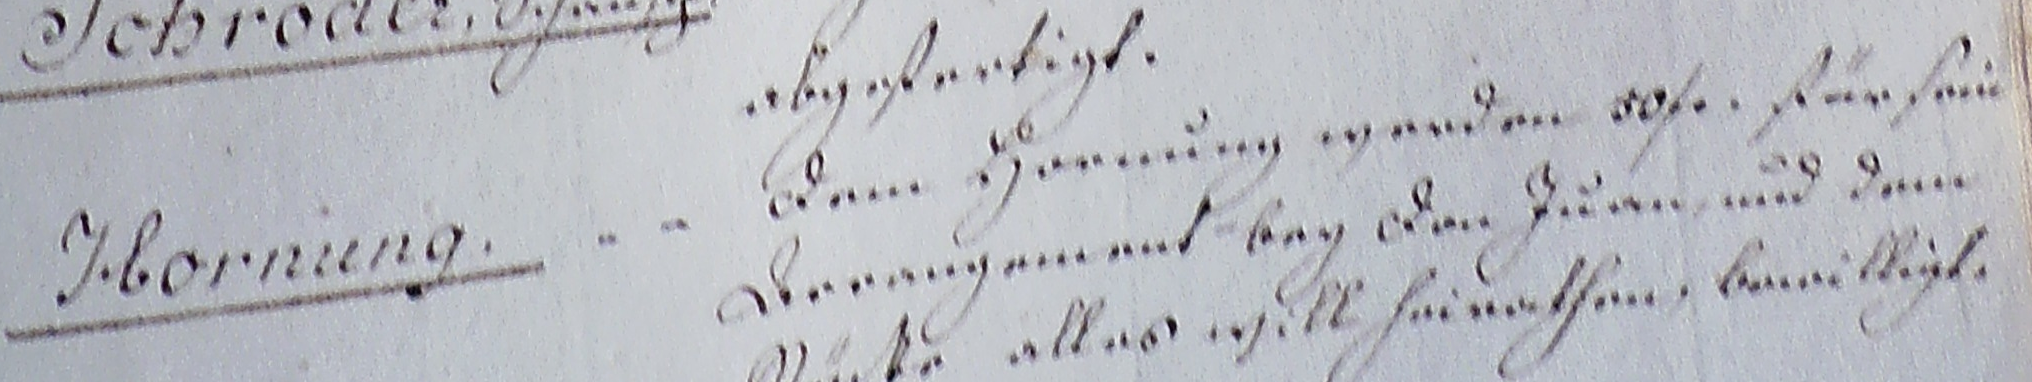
Hornung. .. .. Dem Hornung werden 50fr. für sein
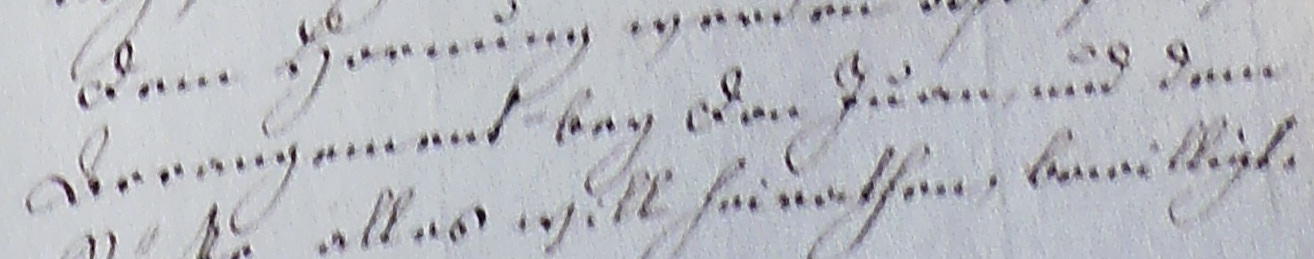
Arrangement bey Don Juan, und dem
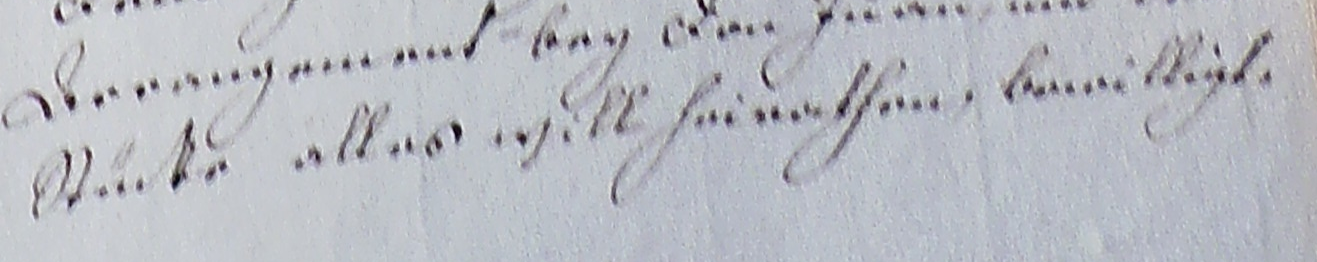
Stücke alles will heirathen, bewilligt.
